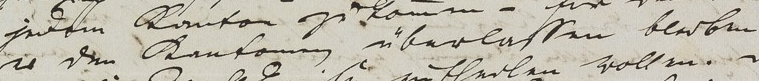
in den Kantonen überlassen bleiben,
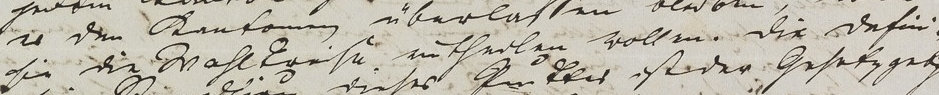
sie die Wahlkreise eintheilen wollen. Die defini-
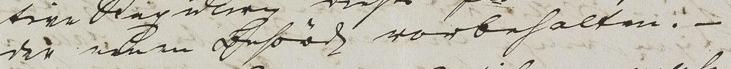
der neuen Behörden vorbehalten. –
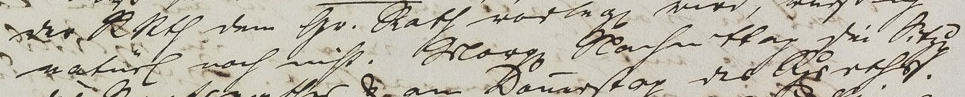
natürlich noch nicht. Morgen Nachmittag sei Sitzung
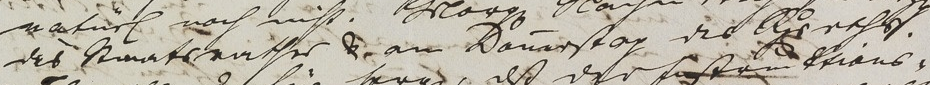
des Staatsrathes & am Donnerstag des Rgierungsrths.
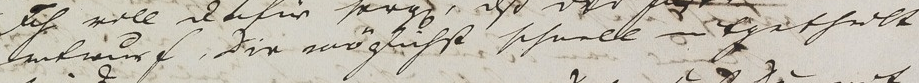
entwurf Dir möglichst schnell mitgetheilt
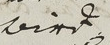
wird. –
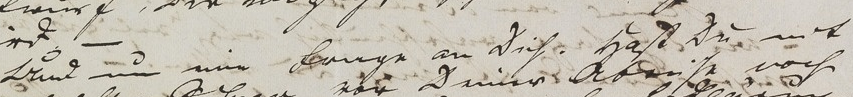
Und nun eine Frage an Dich: Hast Du mit
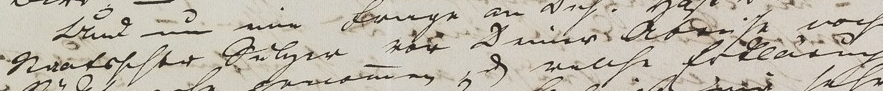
Staatsschbr Sulzer vor Deiner Abreise noch
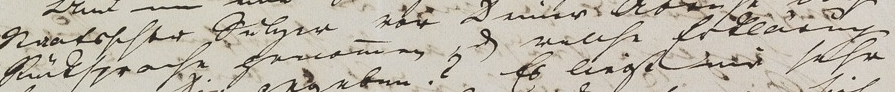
Rücksprache genommen, & welche Erklärung
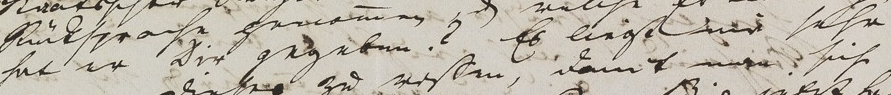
hat er Dir gegeben? Es liegt mir sehr
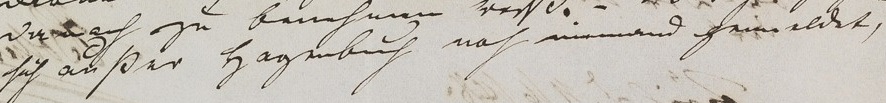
sich außer Hagenbuch noch niemand gemeldet,
